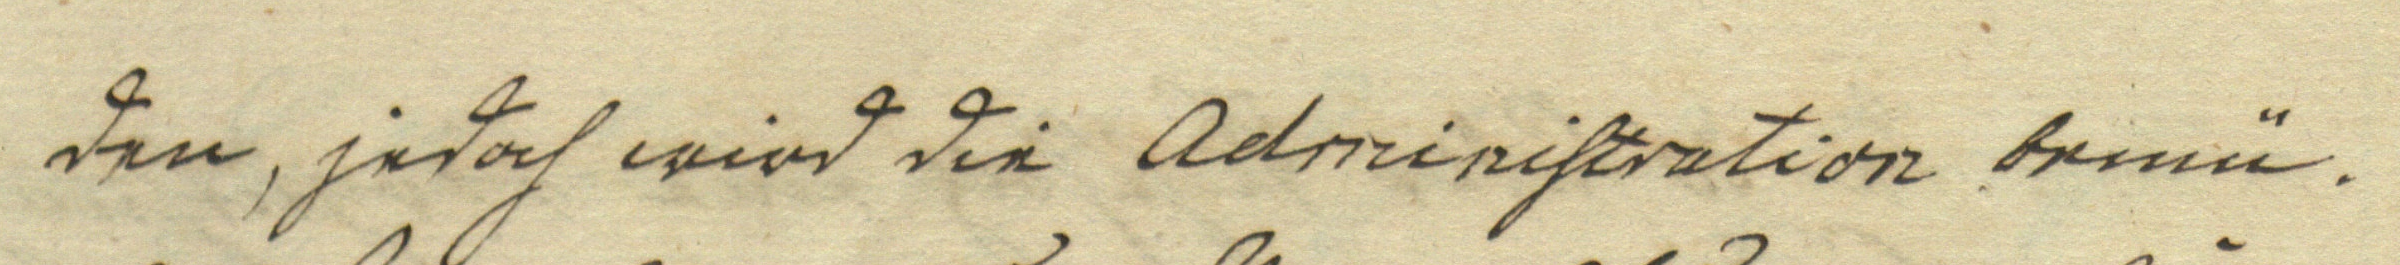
den, jedoch wird die Administration bemü¬
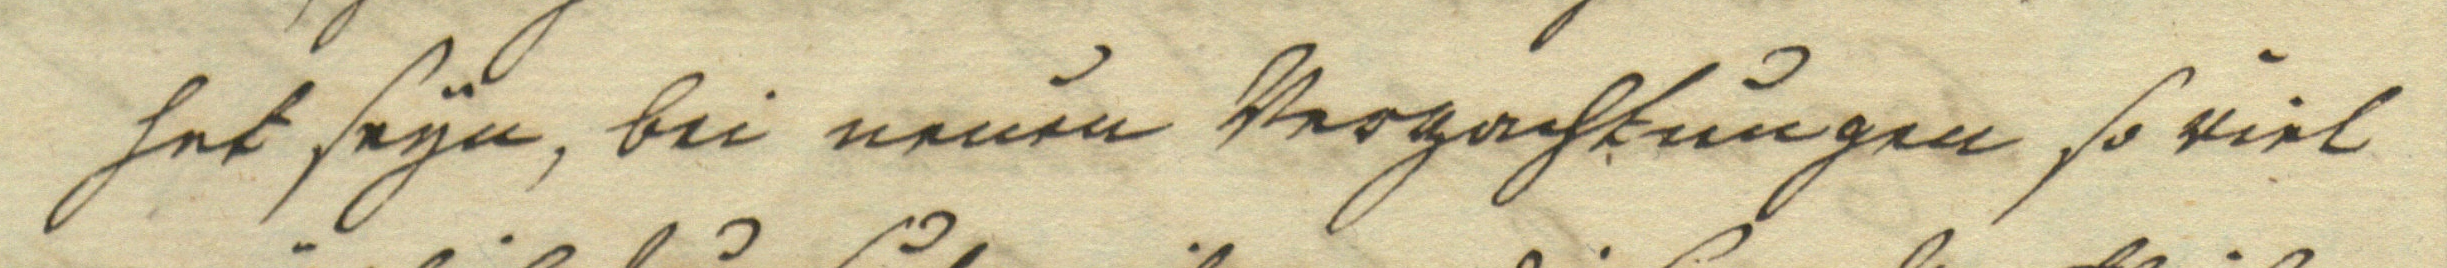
het seÿn, bei neuen Verpachtungen so viel
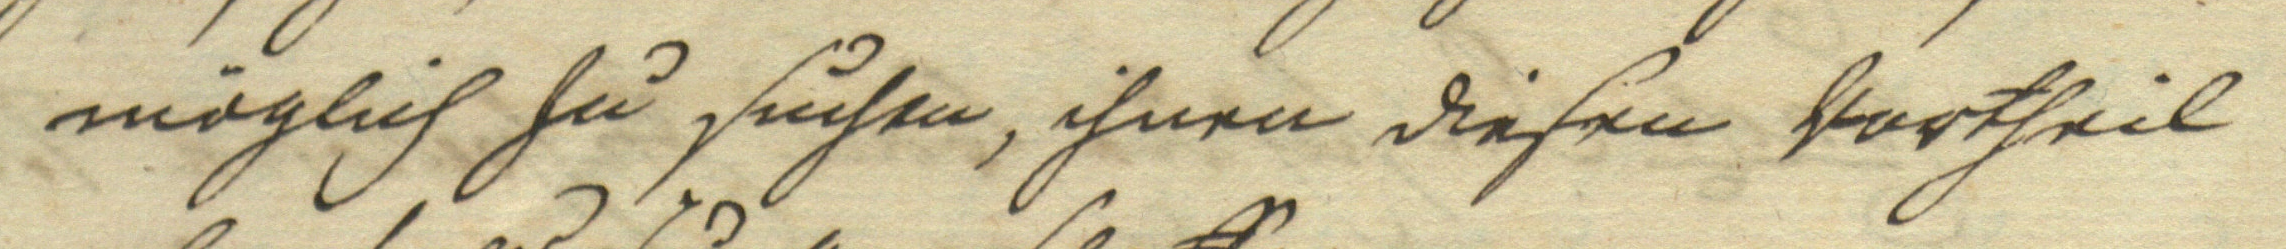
möglich zu suchen, ihnen diesen Vortheil
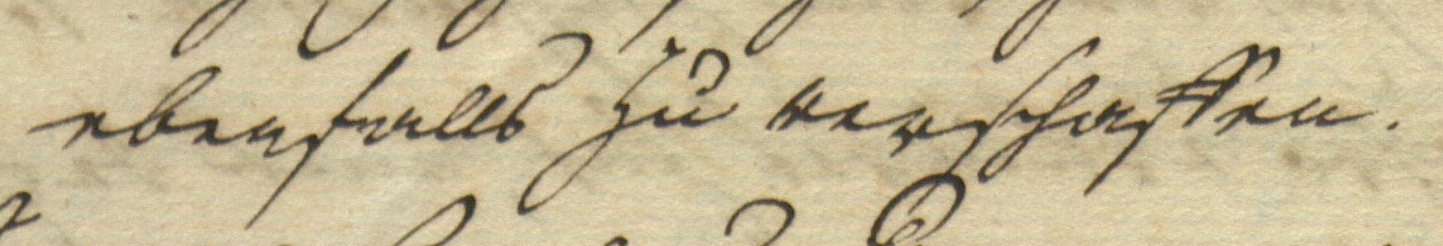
ebenfalls zu verschaffen.
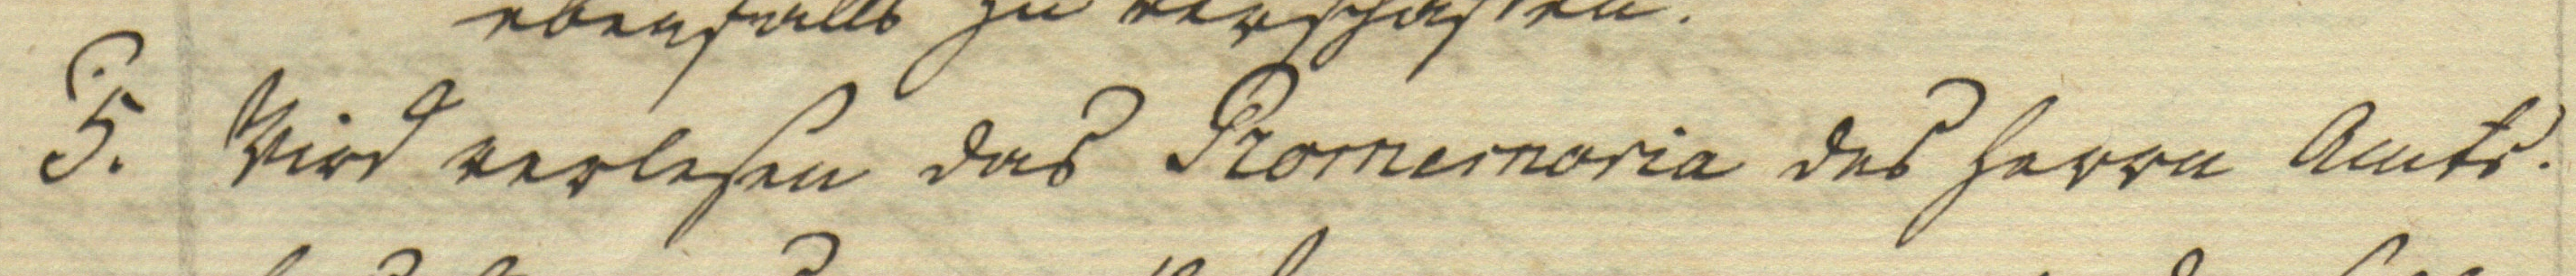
5. Wird verlesen das Promemoria des Herrn Amts¬
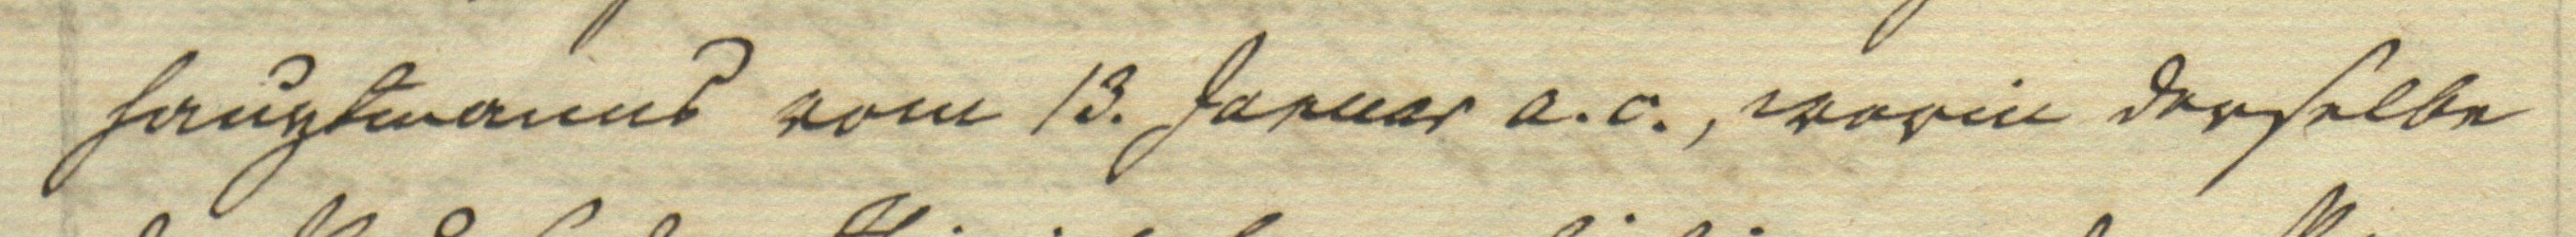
hauptmanns vom 13. Januar a. c., worin derselbe
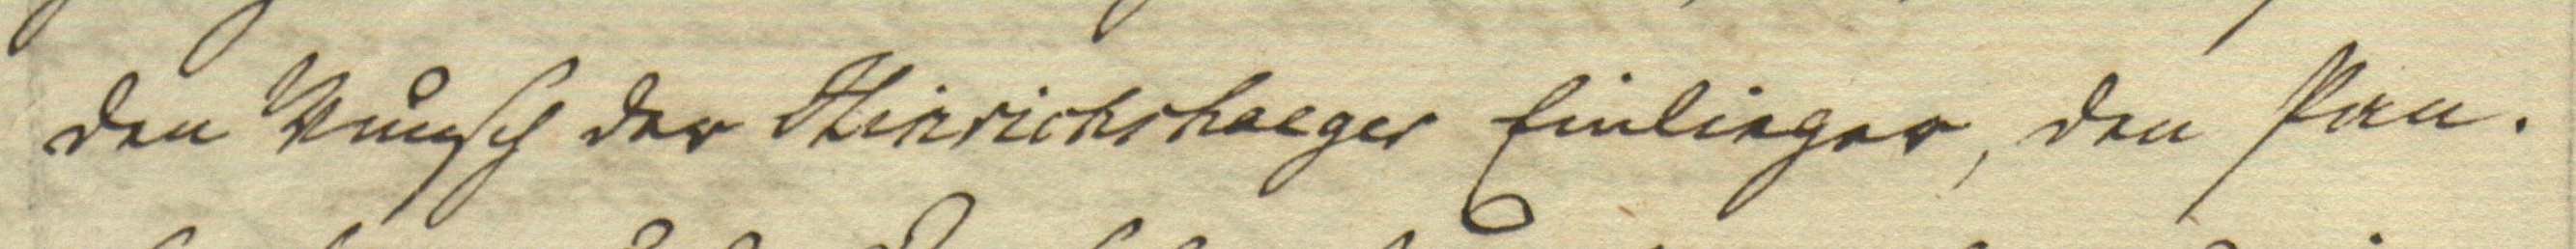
den Wunsch der Hinrichshaeger Einlieger, den Pan¬
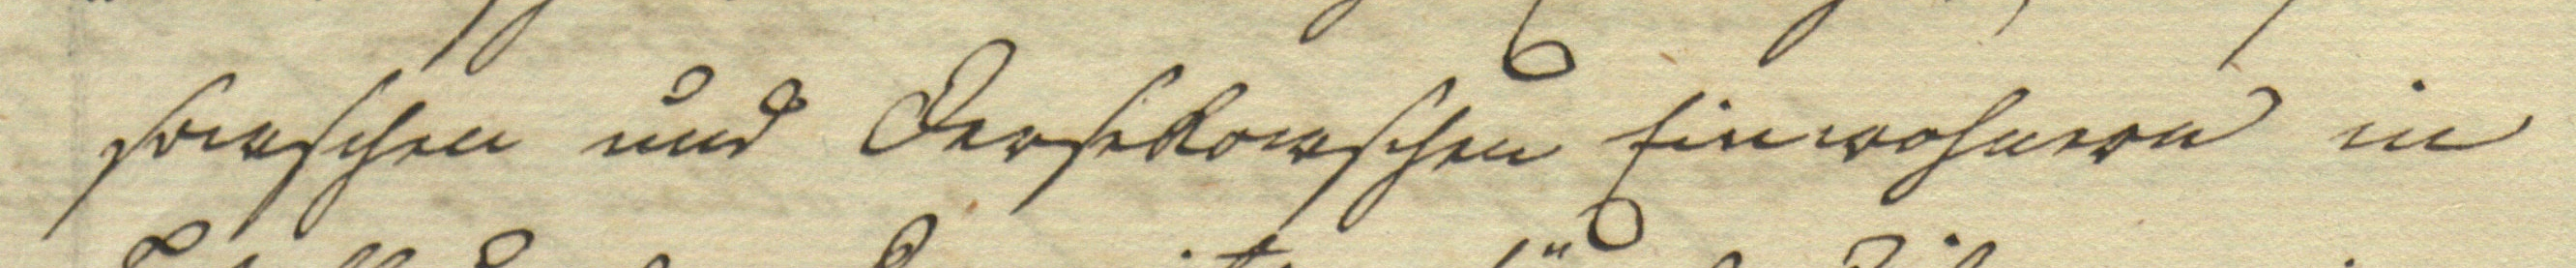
sowschen und Dersekowschen Einwohnern in
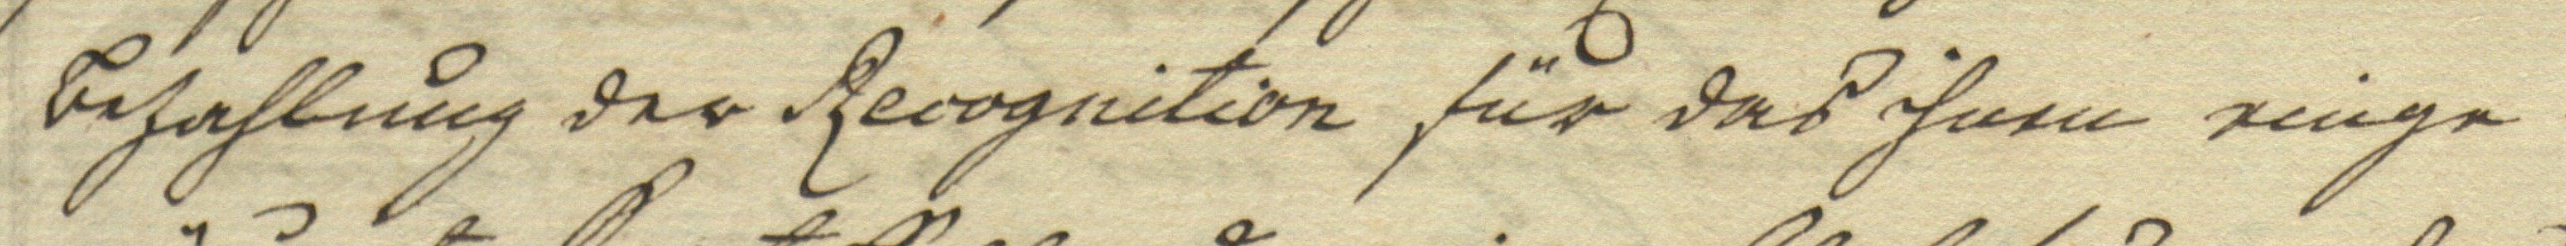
Bezahlung der Recognition für das ihnen einge¬
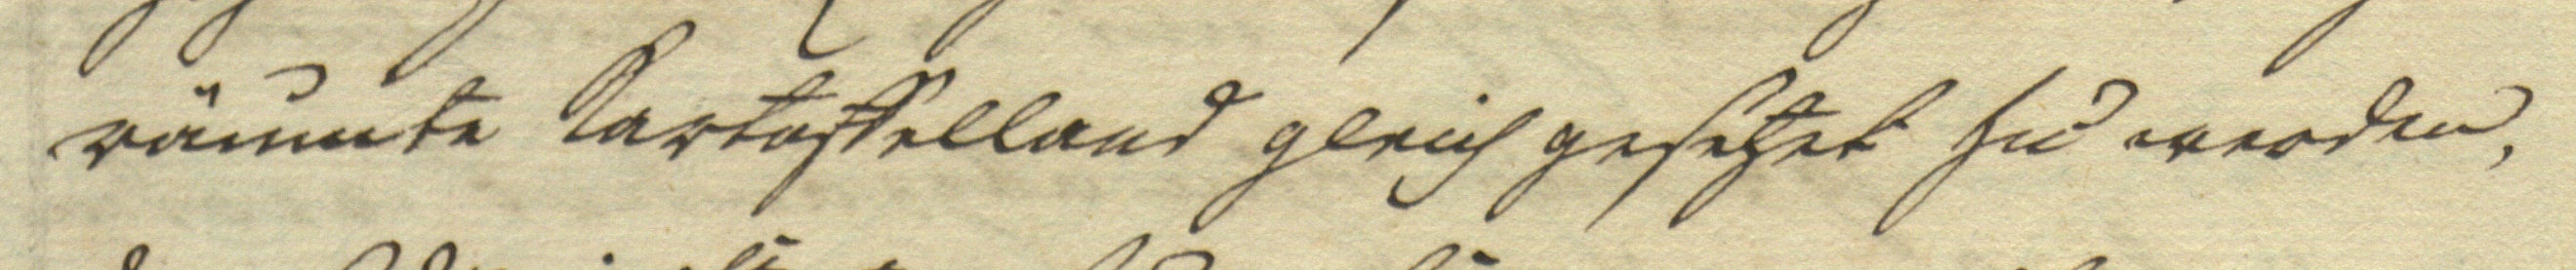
räumte Kartoffelland gleich gesetzet zu werden,
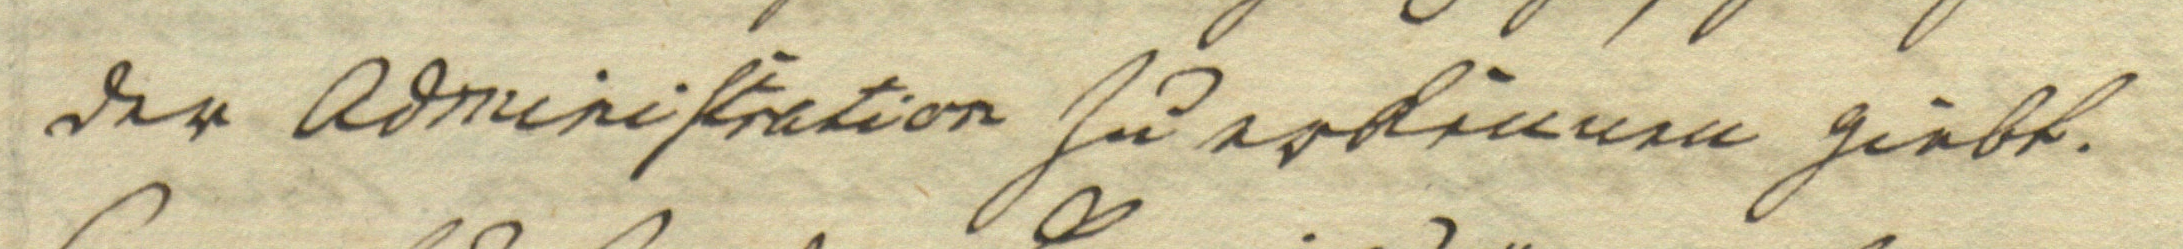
der Administration zu erkennen giebt.
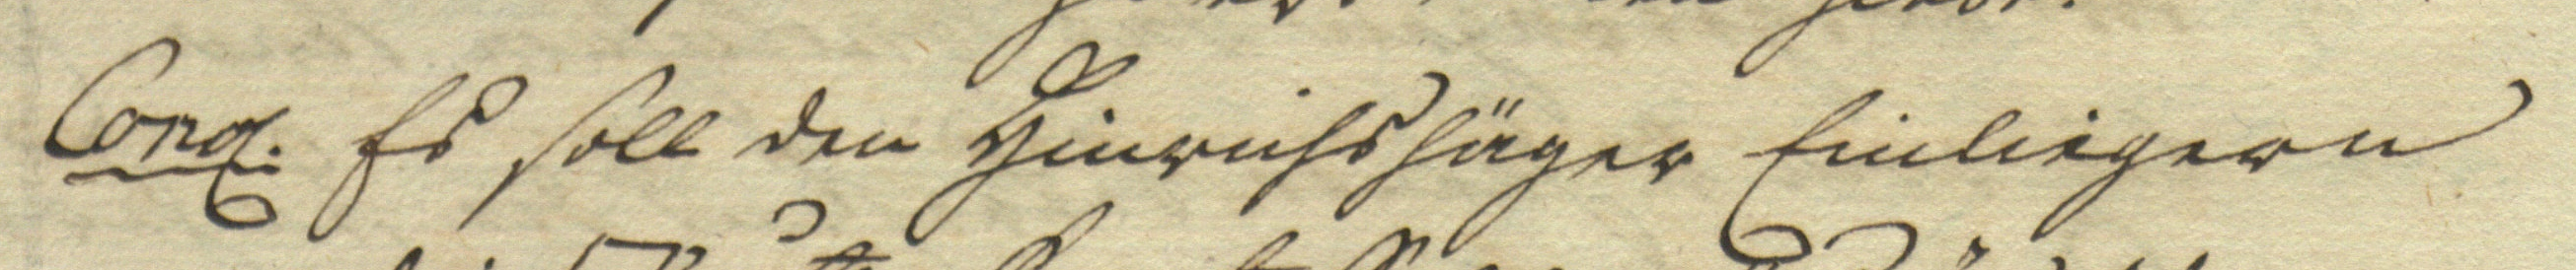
Concl. Es soll den Hinrichshäger Einliegern
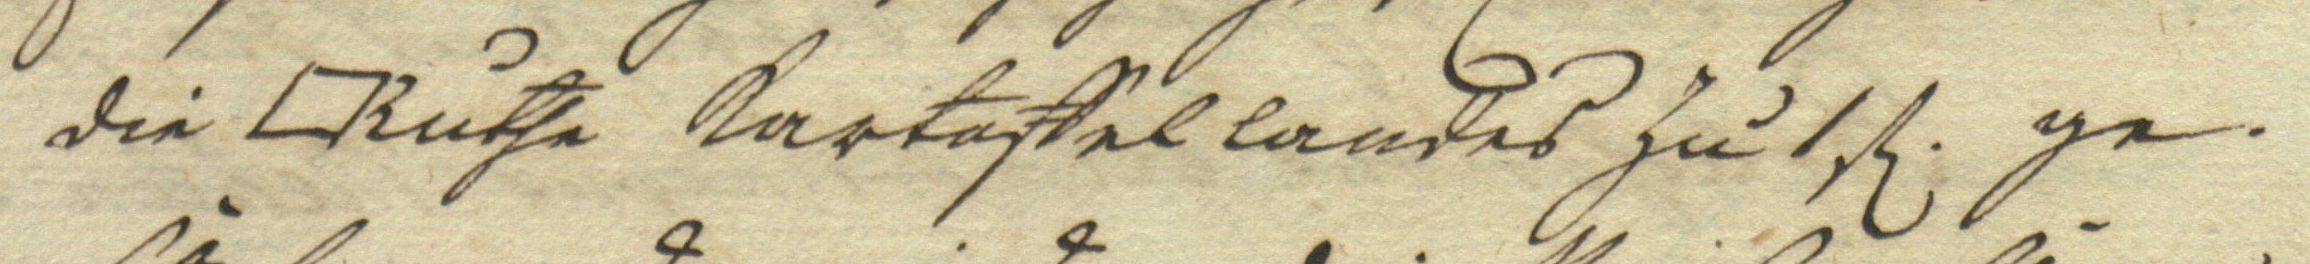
die םRuthe Kartoffellandes zu 1 s. ge¬
